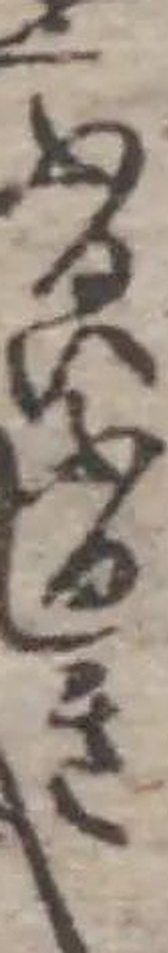ふるいふるしき
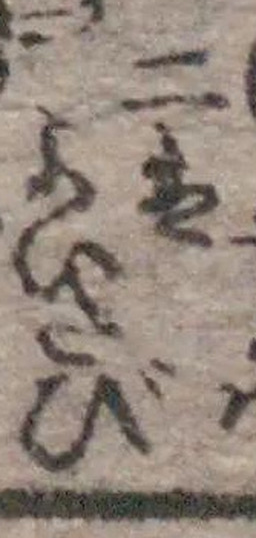よいたび
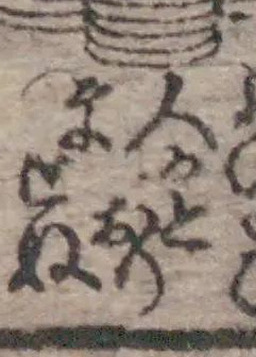ませぬ
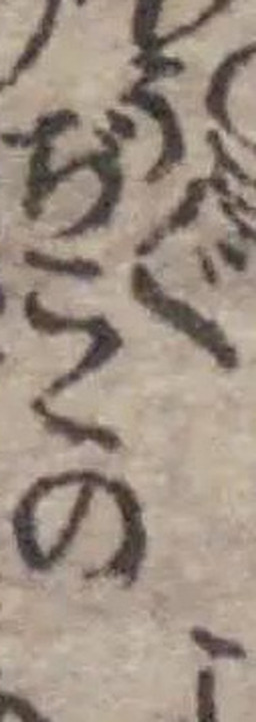ぢこくの
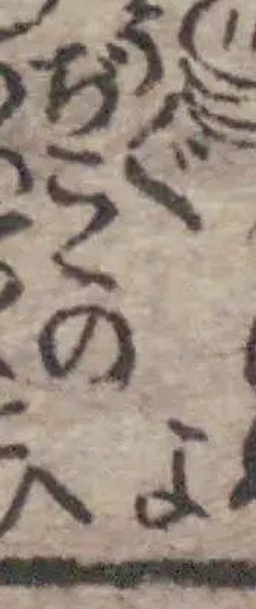ぢこくの
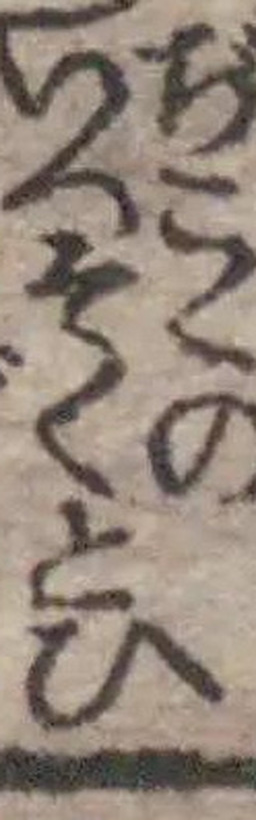いつそくとひ
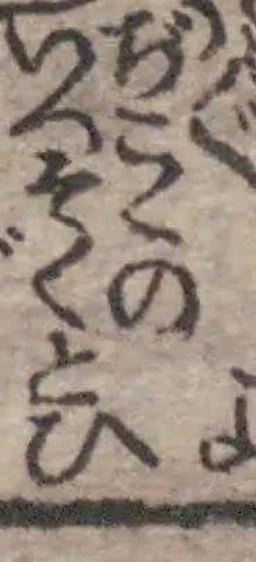いつそくとひ
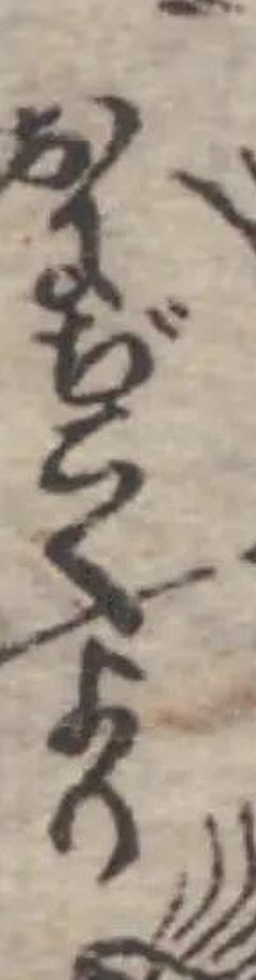おにぢこくより
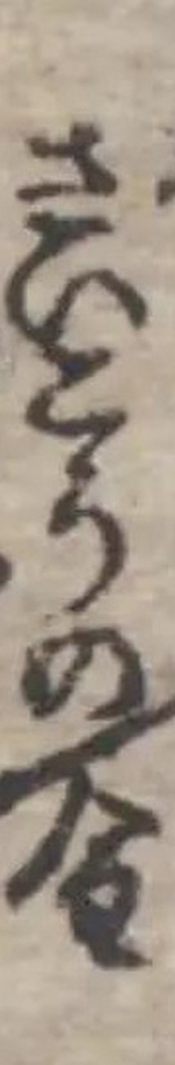さいこうの金
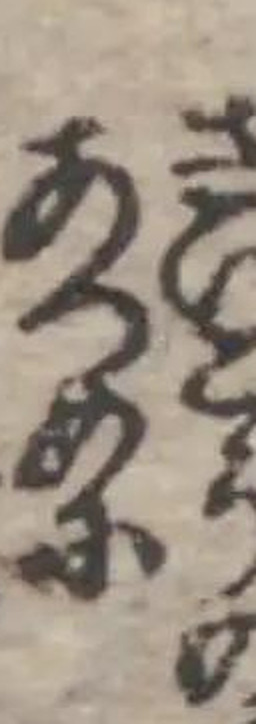あつめに
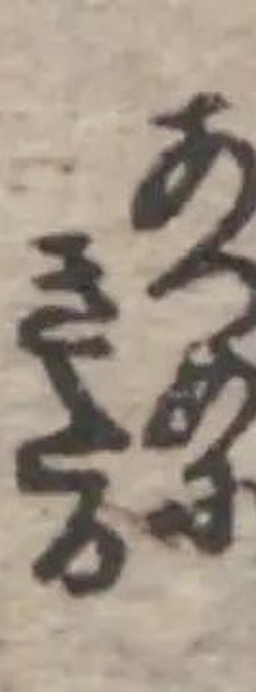きたる
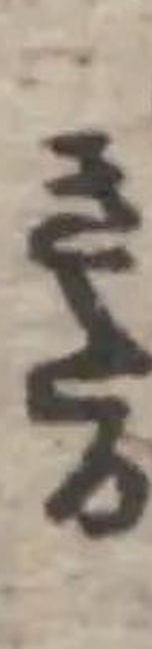きたる
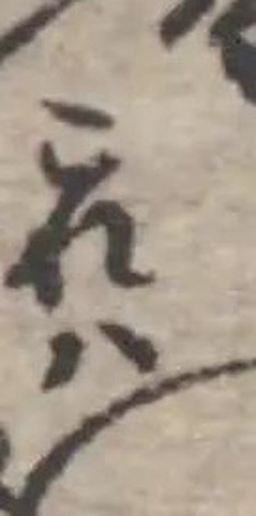これは
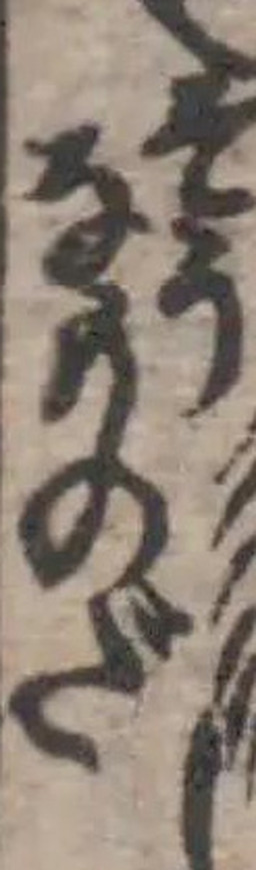なものだ
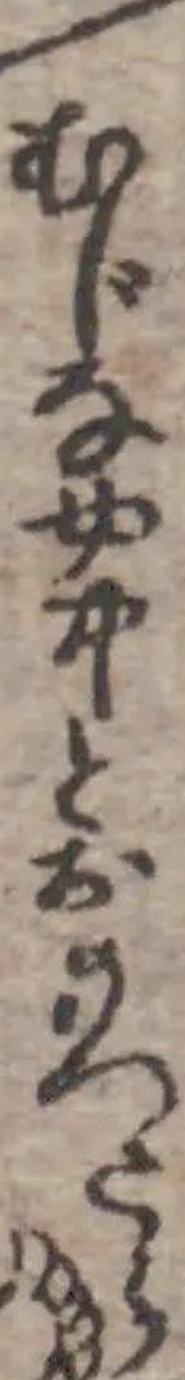むじな女中とおもつたら
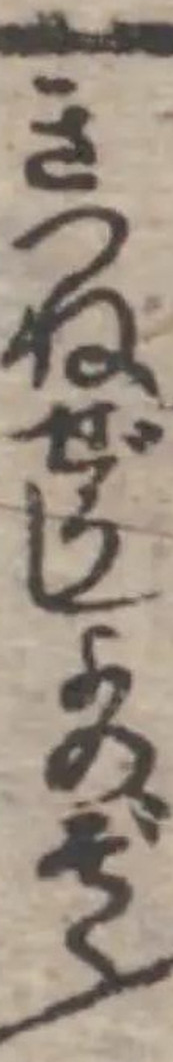きつねせうじゟのぞく
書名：大磯地蔵咄 2巻
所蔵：国立国会図書館 National Diet Library, JAPAN
